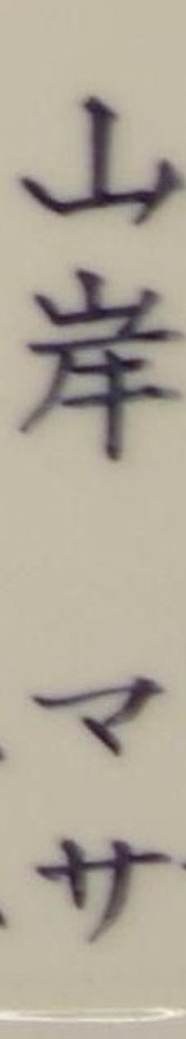山岸マサ
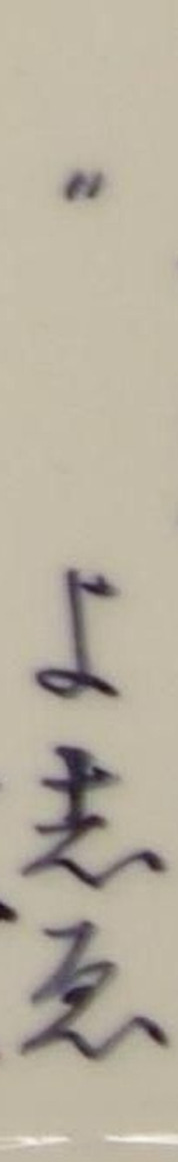よしえ
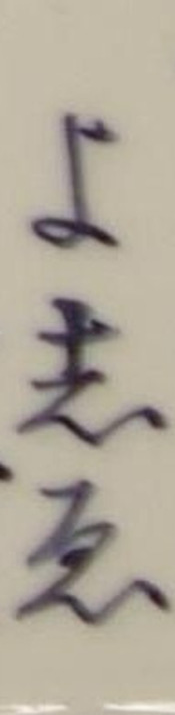よしえ
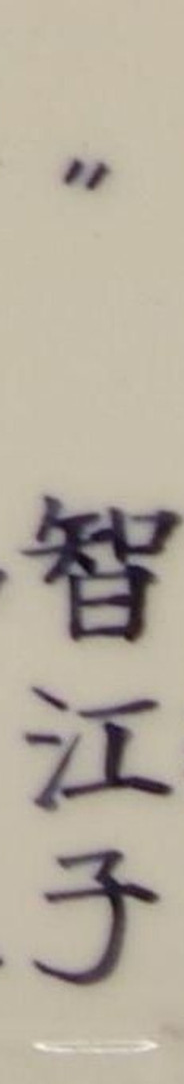智江子
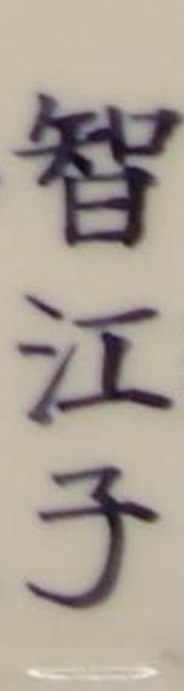智江子
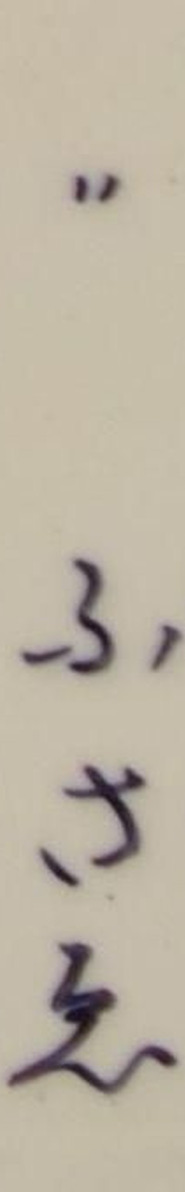ふさえ
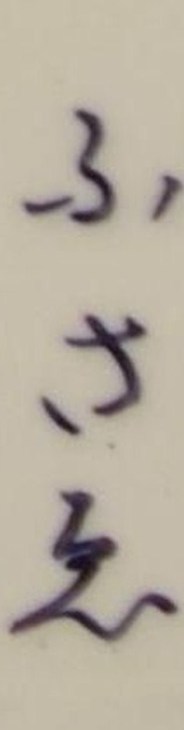ふさえ
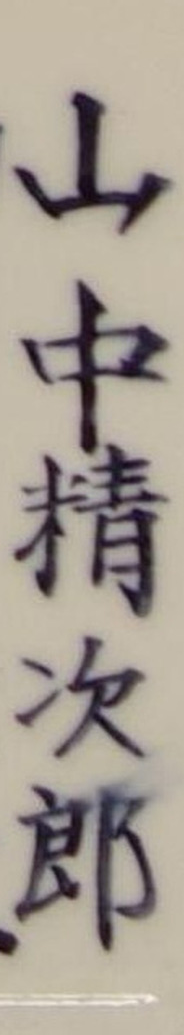山中精次郎
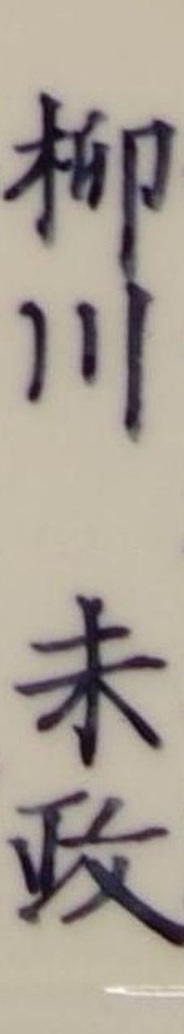柳川未政
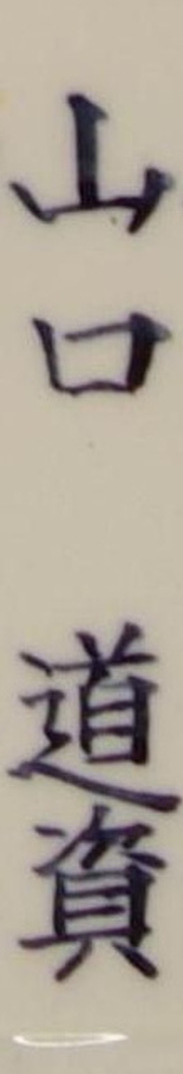山口道資
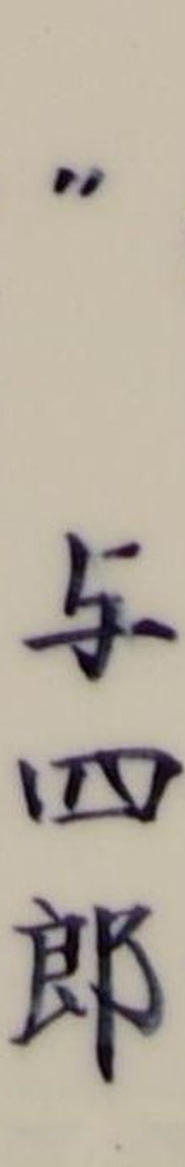与四郎
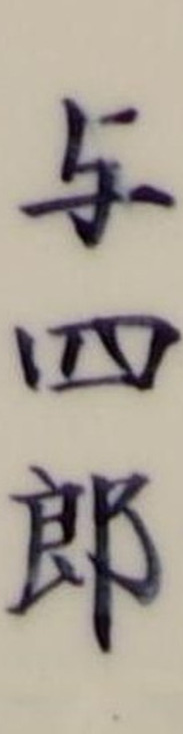与四郎
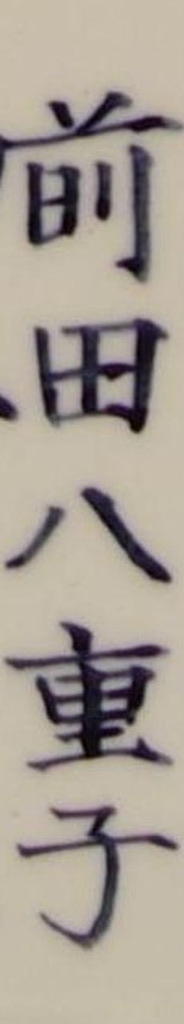前田八重子
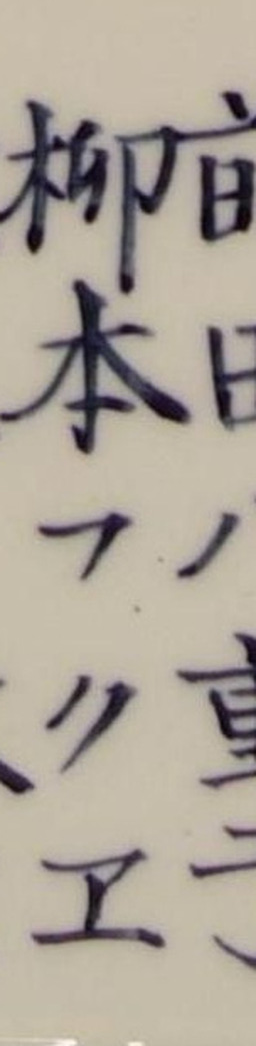柳本フクエ
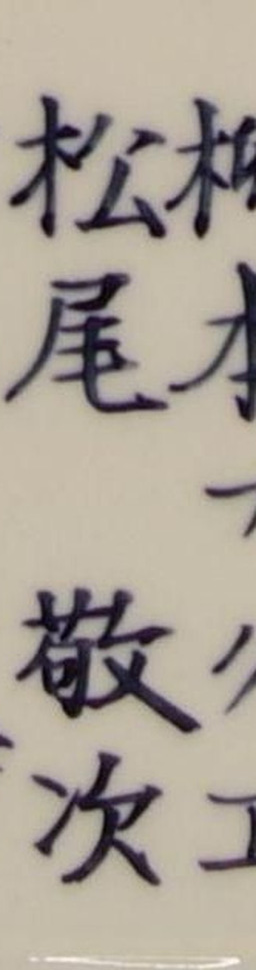松尾敬次
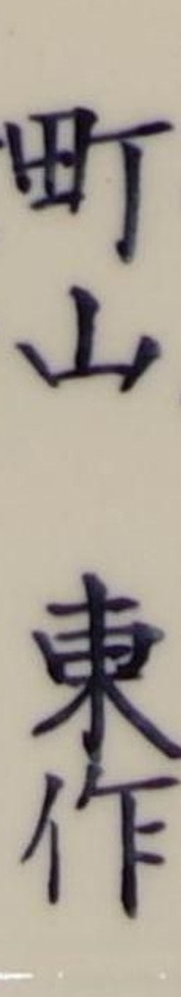町山東作
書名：E~L
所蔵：高野山金剛峯寺
